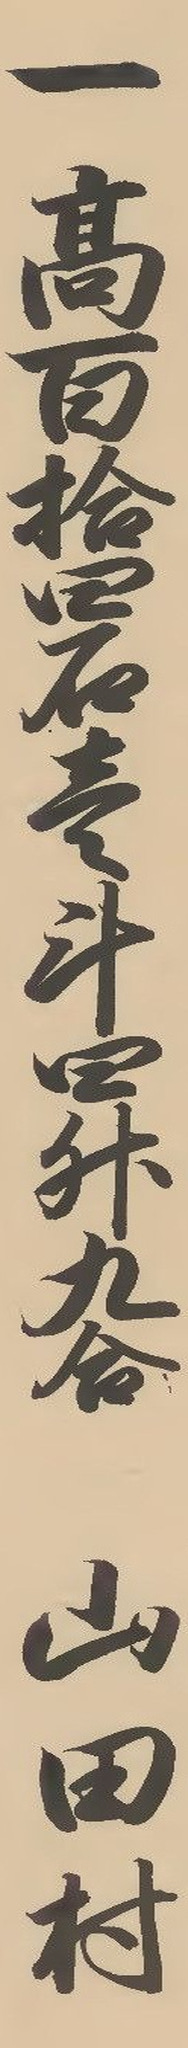一高百拾四石壱斗四升九合山田村
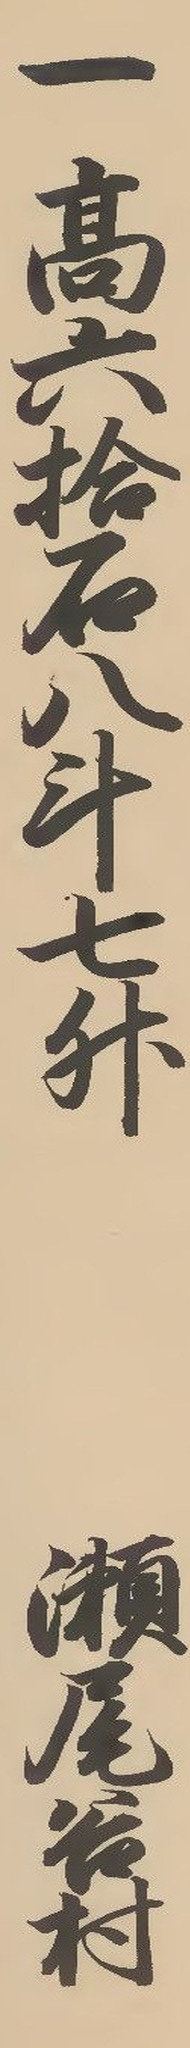一高六拾石八斗七升瀬尾谷村
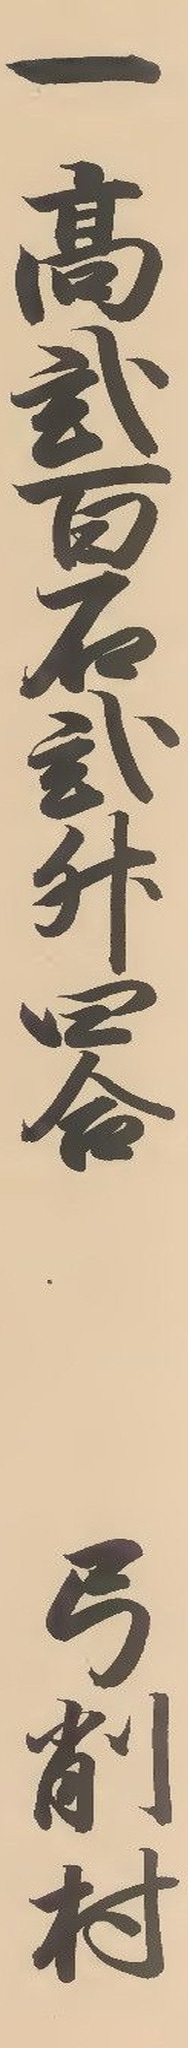一高弐百石弐升四合弓削村
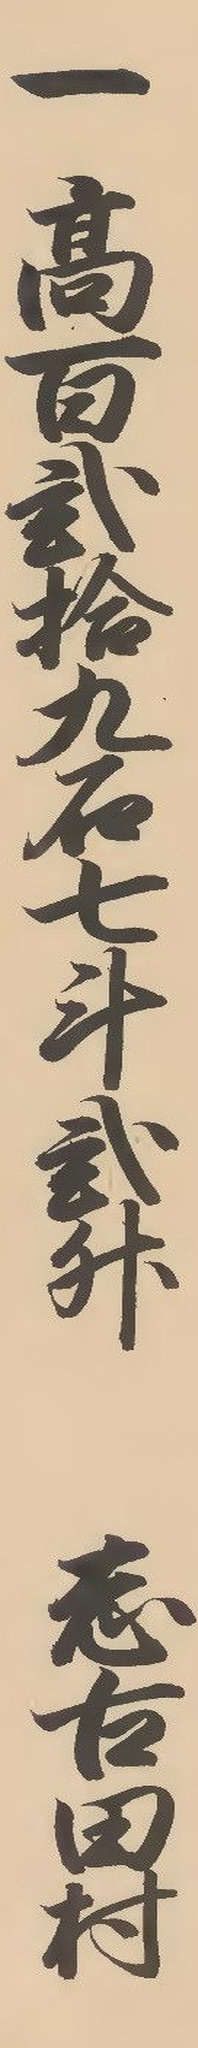一高百弐拾九石七斗弐升志古田村
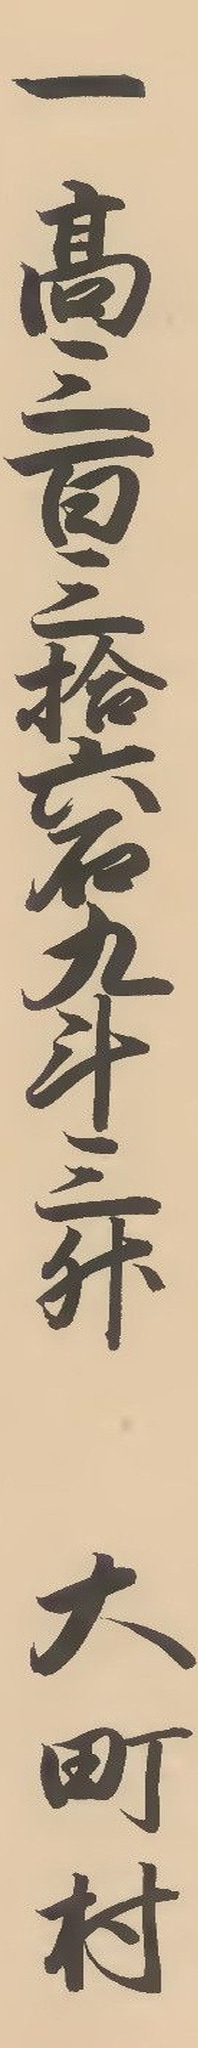一高三百三拾六石九斗三升大町村
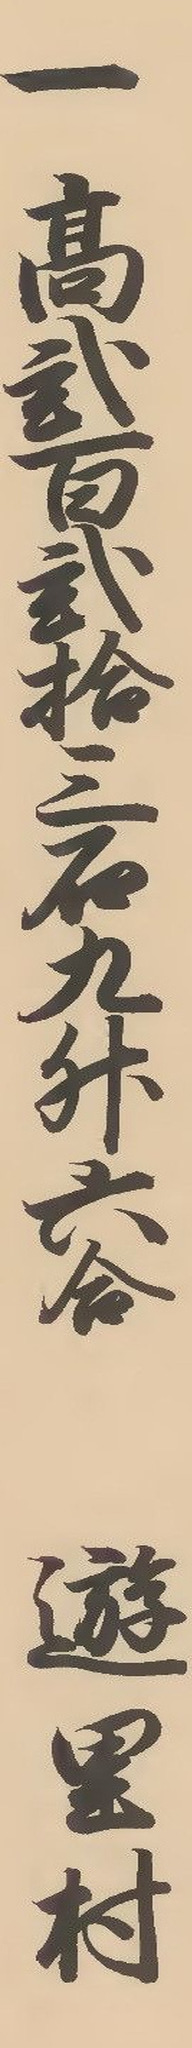一高弐百弐拾三石九升六合遊里村

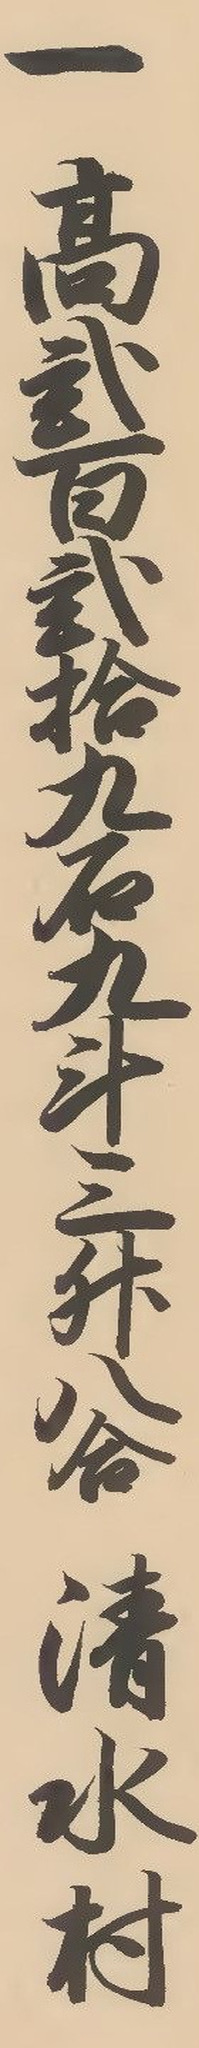一高弐百弐拾九石九斗三升八合清水村
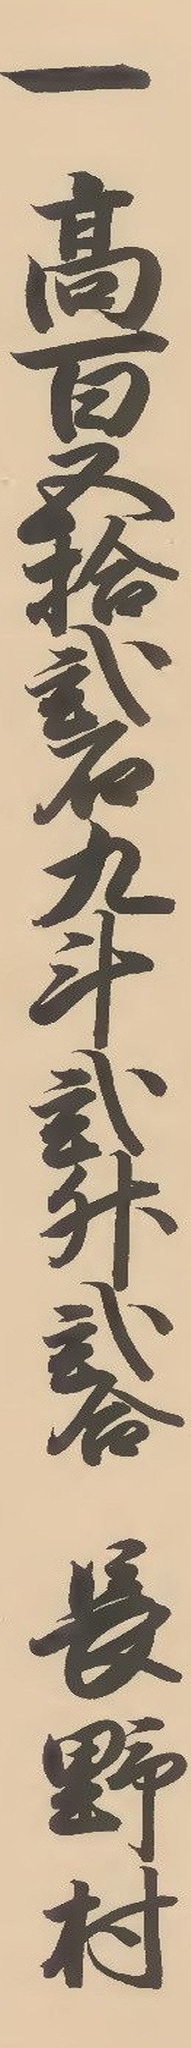一高百五拾弐石九斗弐升弐合長野村
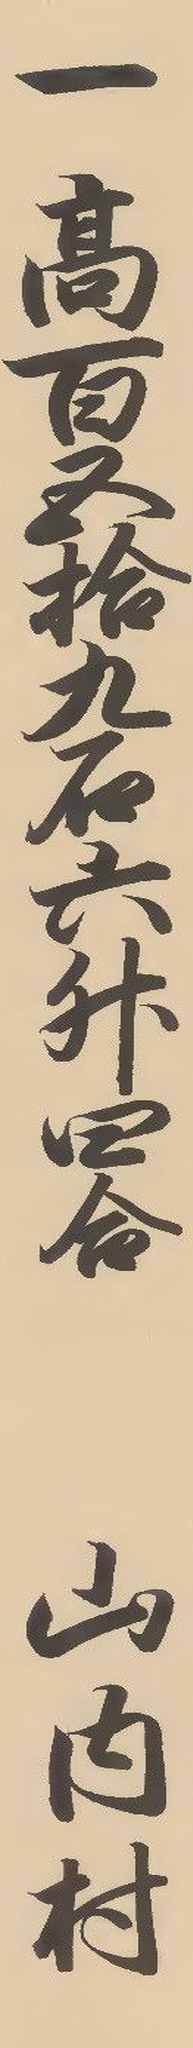一高百五拾九石六升四合山内村
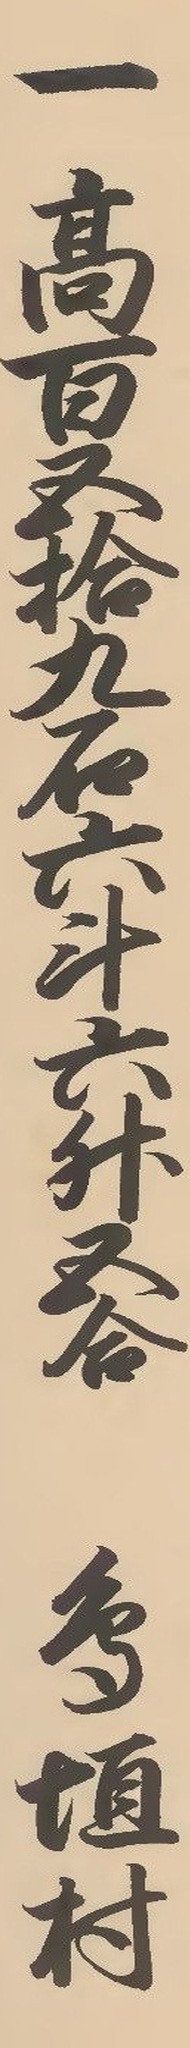一高百五拾九石六斗六升五合鳥垣村
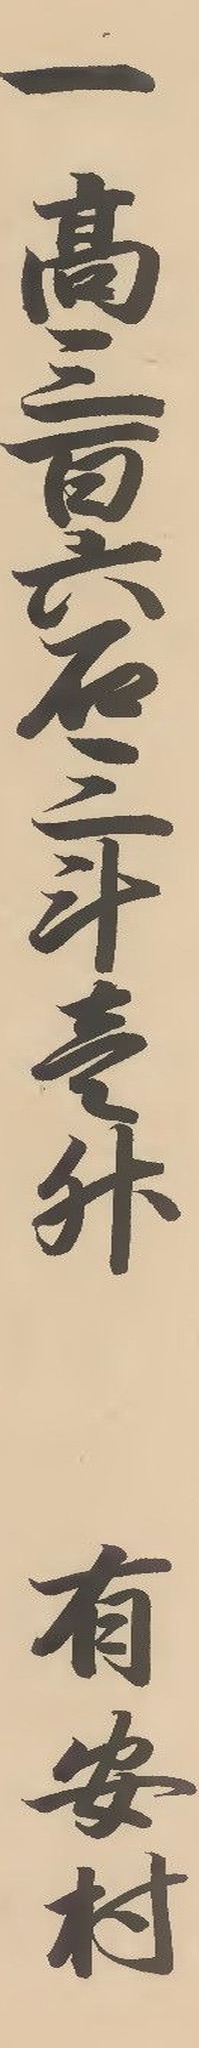一高三百六石三斗壱升有安村
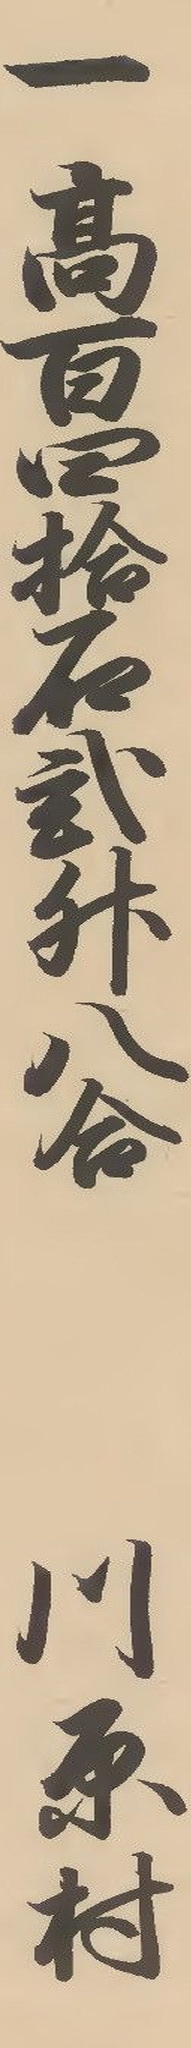一高百四拾石弐升八合川原村

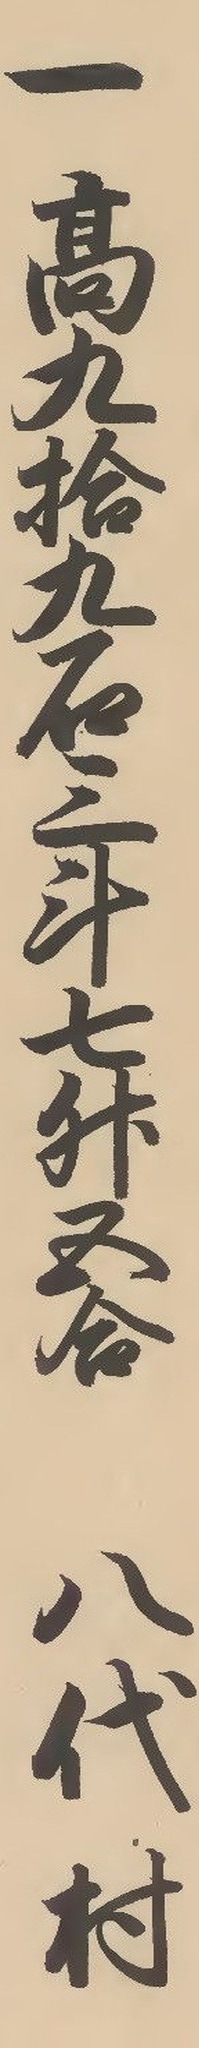一高九拾九石三斗七升五合八代村
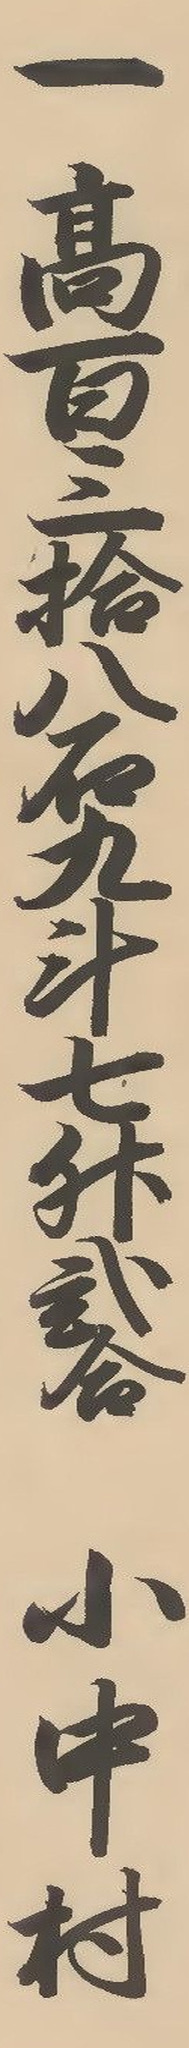一高百三拾八石九斗七升弐合小中村
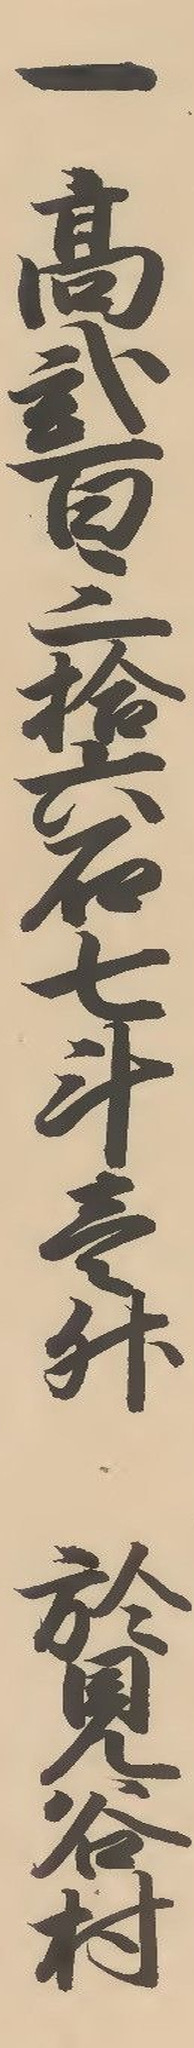一高弐百三拾六石七斗壱升於見谷村
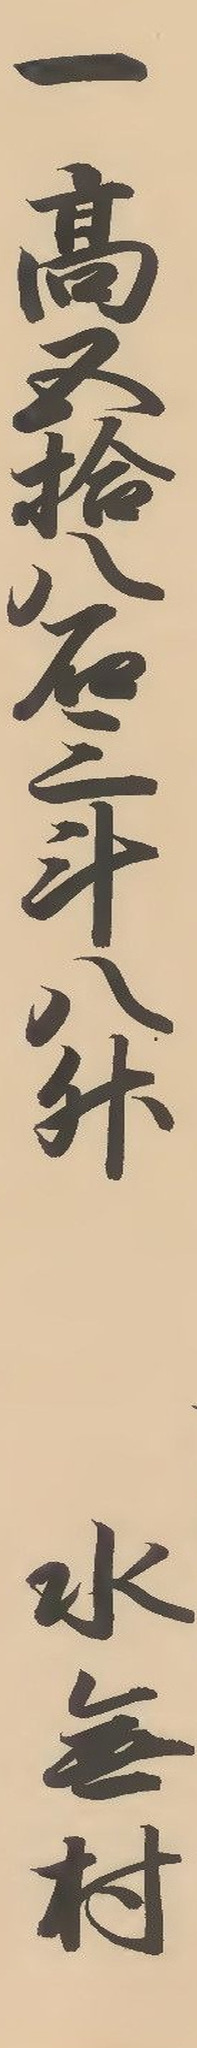一高五拾弐石三斗弐升辻村
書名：丹波国郷帳
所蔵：国立公文書館 National Archives of Japan
